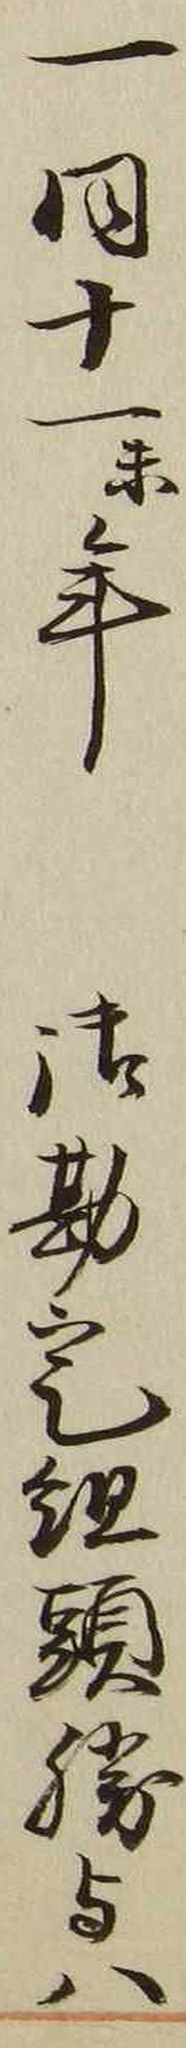一同十一未年御勘定組頭勝与八
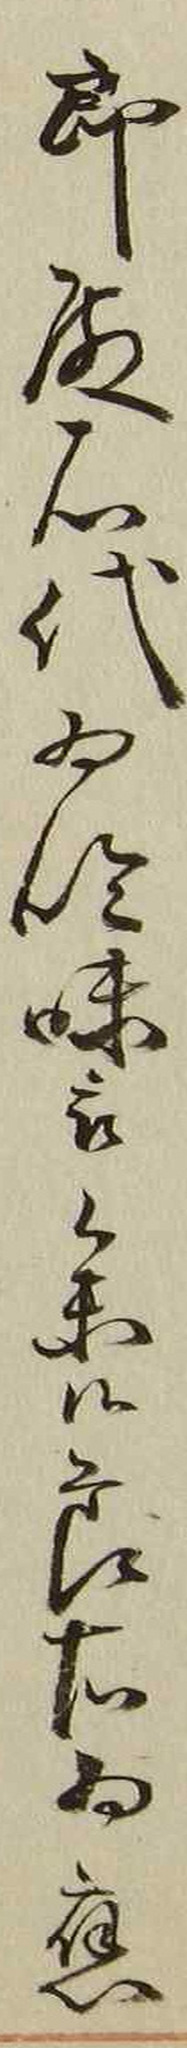郎殿石代為吟味被参候節右為応
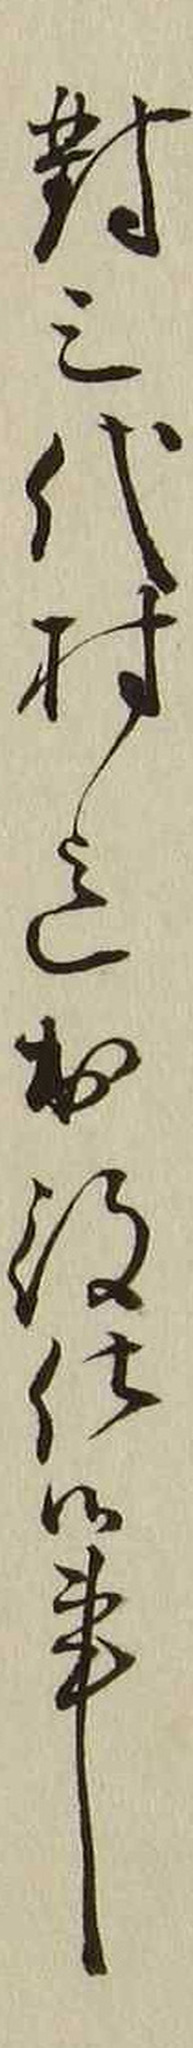対三代村迄出役仕候事
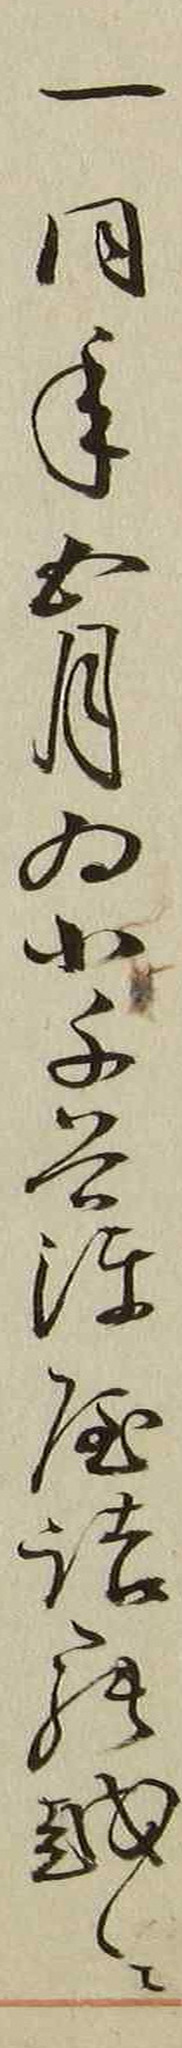一同年五月為小千谷陣屋詰罷越候ニ
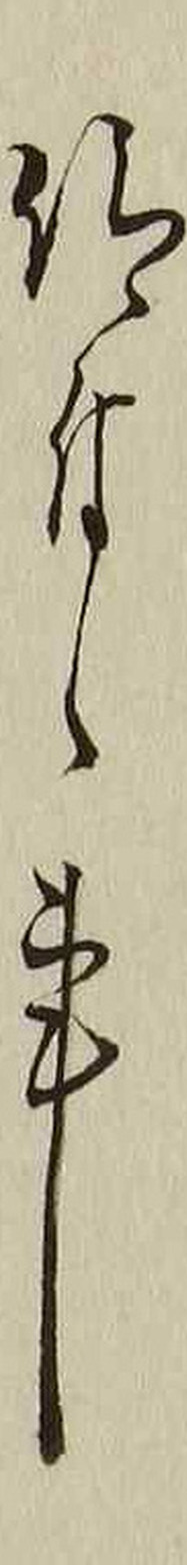仰付候事
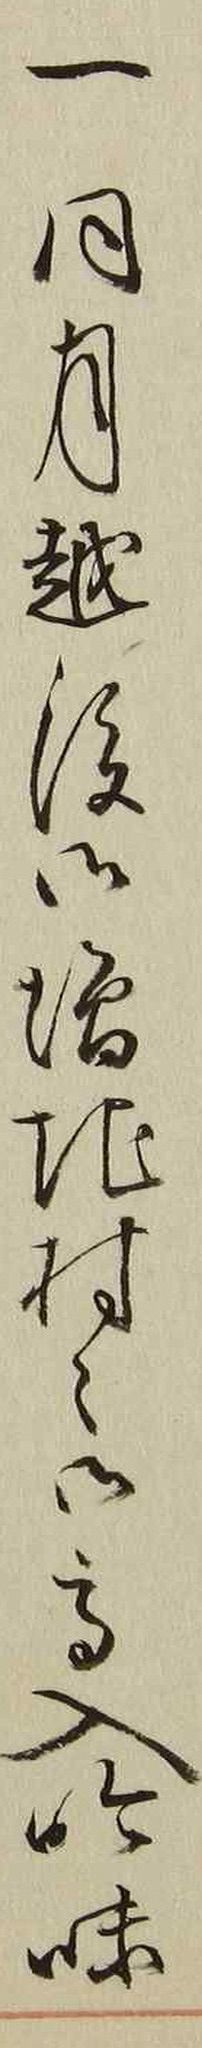一同月越後御増地村々御高入吟味
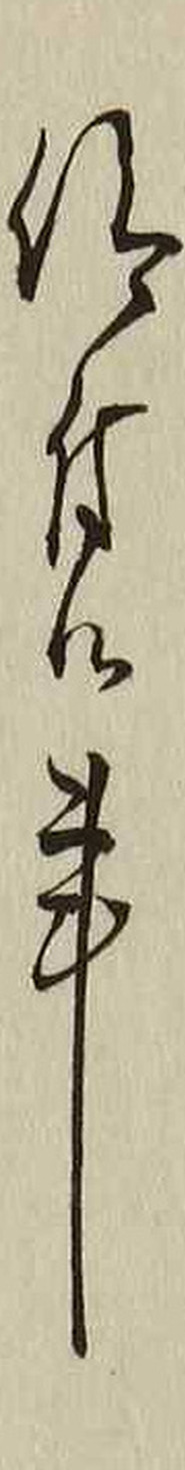仰付候事
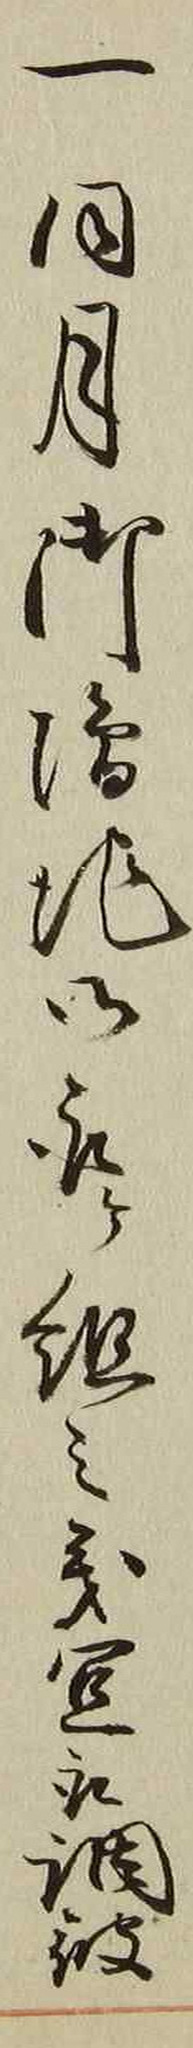一同月御増地御取ヶ組之義宜取調彼
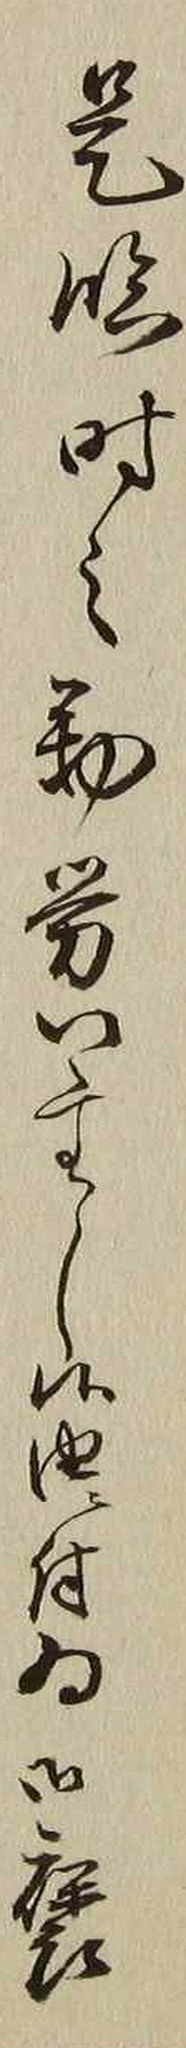是臨時之勤労いたし候由ニ付為御褒
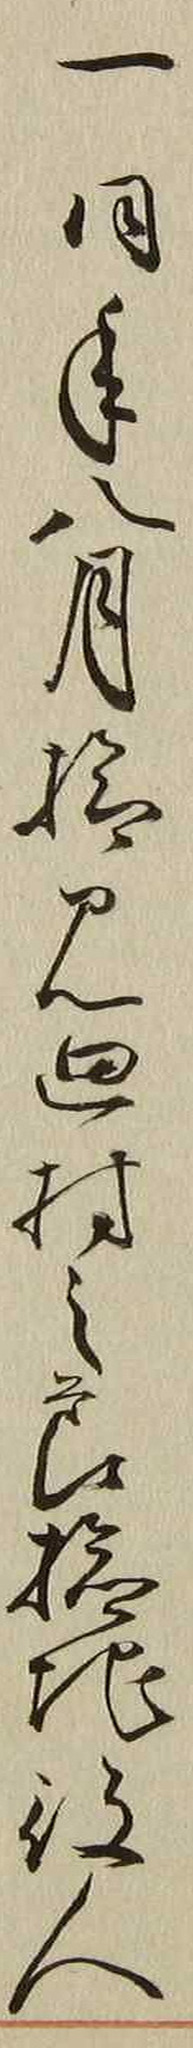一同年八月検見廻村之節検地役人
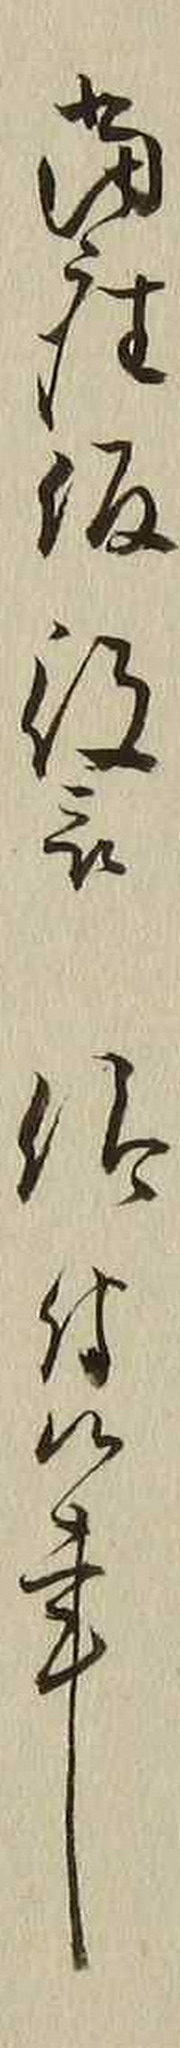当座仮役被仰付候事
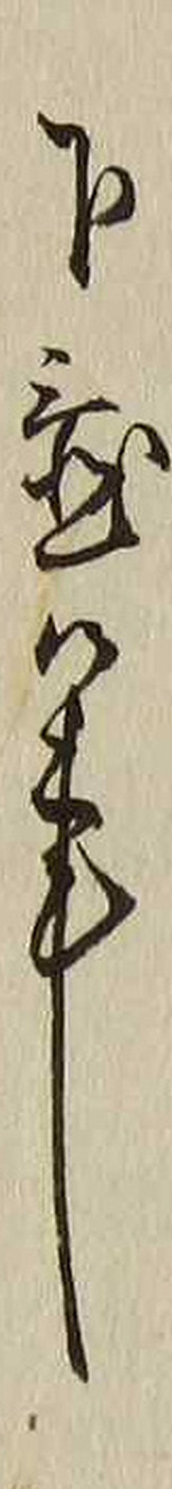下置候事
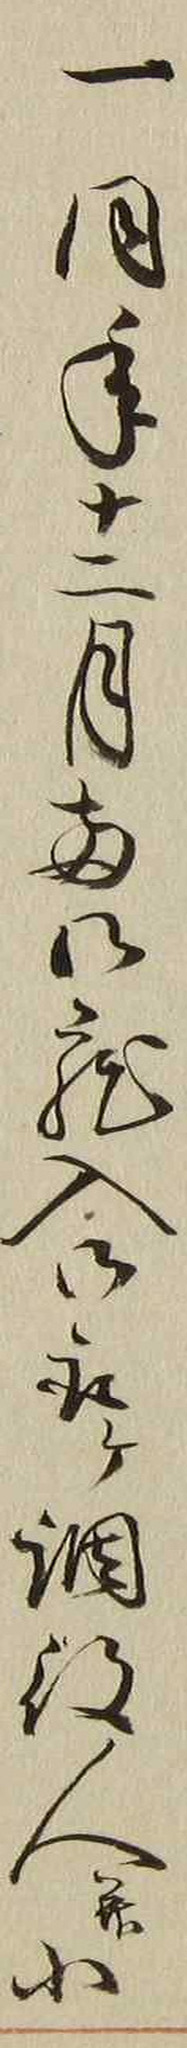一同年十二月両御蔵入御取ヶ調役人并小
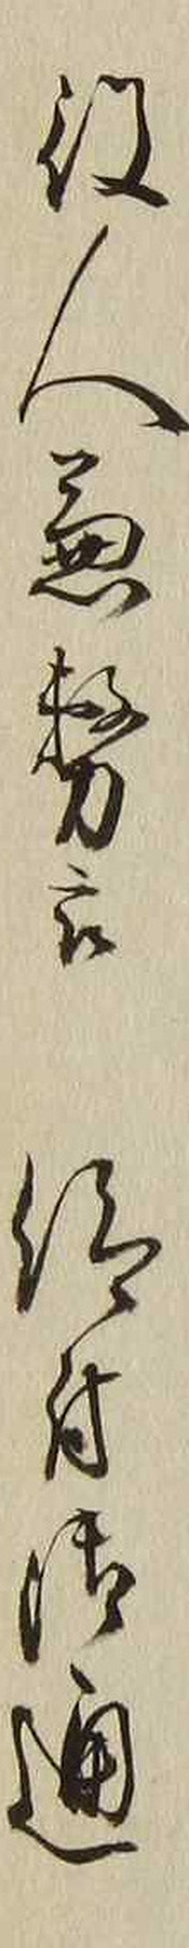役人兼務被仰付御通
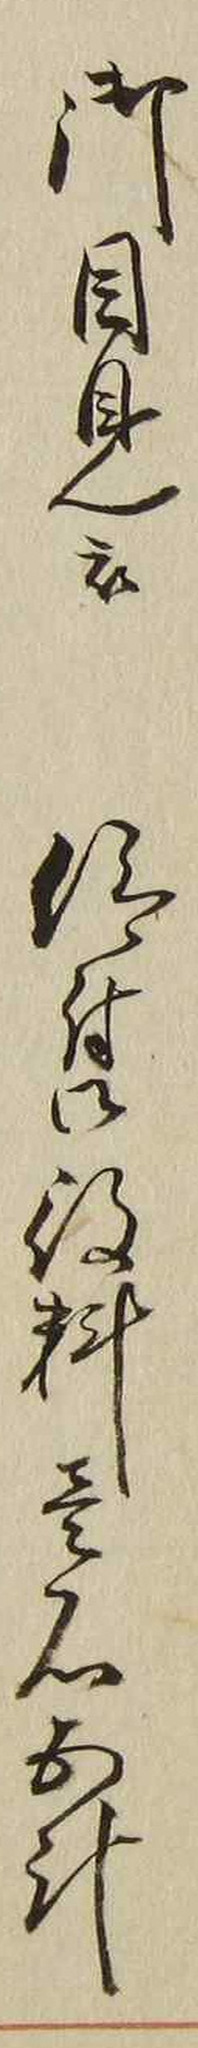御目見被仰付御役料壱石五斗

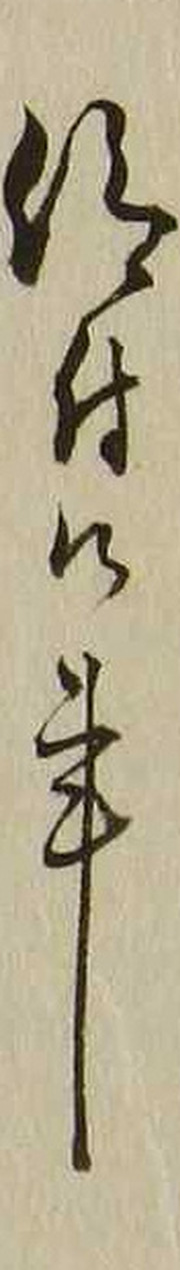仰付候事
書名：諸士系譜　巻之57　ほ之部4
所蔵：会津若松市立会津図書館
